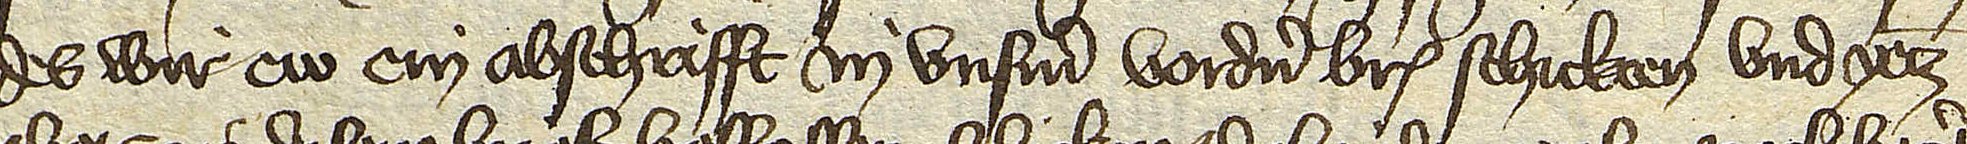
des wir ew ein abſchrift in vnſm* vordn* br* ſchickten vnd yecʒ*
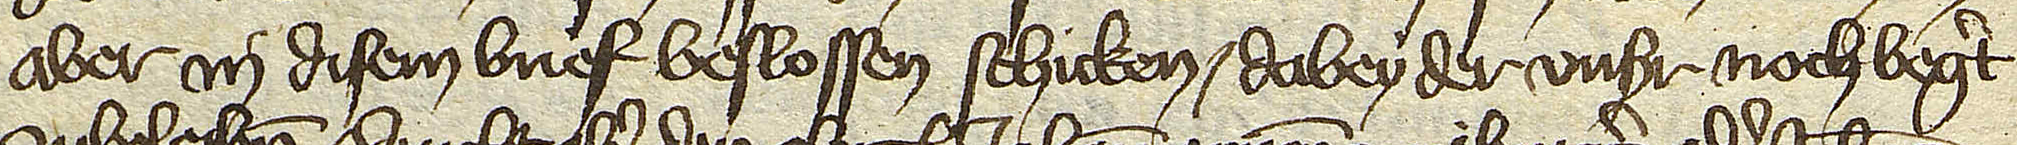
aber in diſem brief beſloſſen ſchicken / dabey der vnſ*r noch beg*t
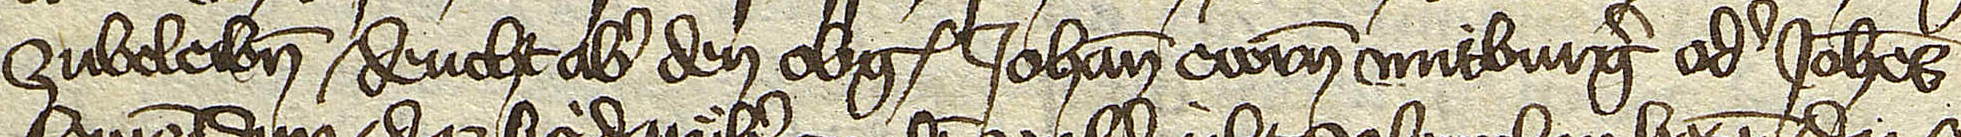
cʒubeleibn* / deucht ab* den obg* Iohan* ewrn* mitburg* od* Iohes*
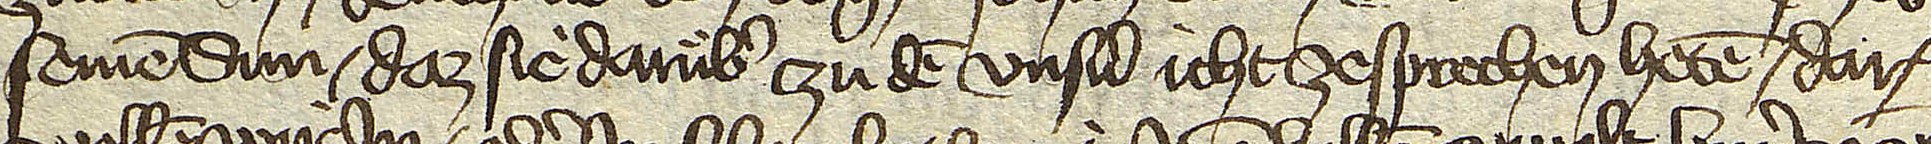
ſeine* Sun / daʒ ſie darüb* cʒu d* vnſn* icht cʒeſprechen hete* / dar*
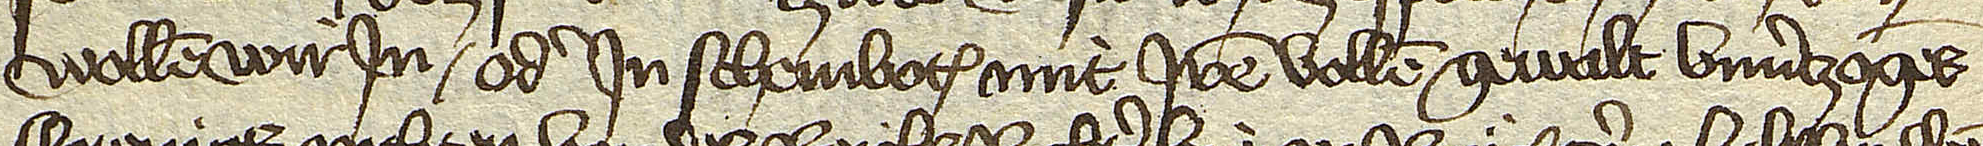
wolle* wir In / od* Ir ſcheinbot* mit Ire* volle* gewalt vnu*cʒoges*
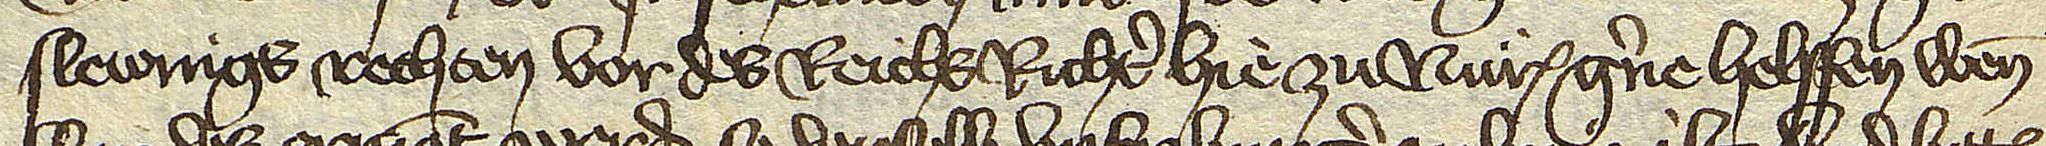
ſlewnigs rechten vor des Reichs Richt* hie cʒu Nür* g*ne helffen wen*
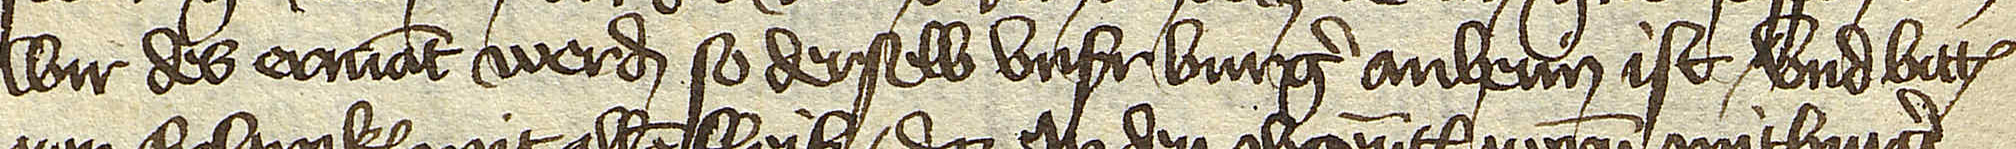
wir des ermant* werd* ſo derſelb vnſ*r burg* anheim iſt / vnd bitt*
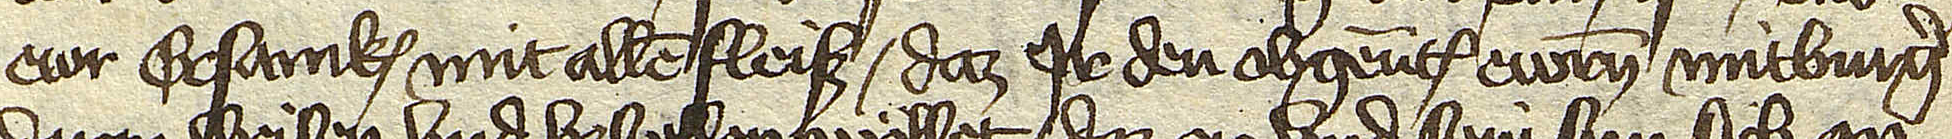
ewr Erſamk* mit alle* fleiſʒ / daʒ Ir den obgent* ewrn* mitburg*
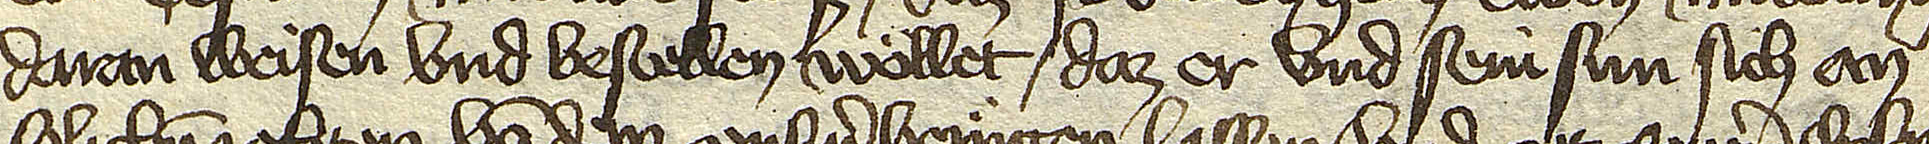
daran weiſen vnd beſtellen wöllet / daʒ er vnd ſein ſun ſich an
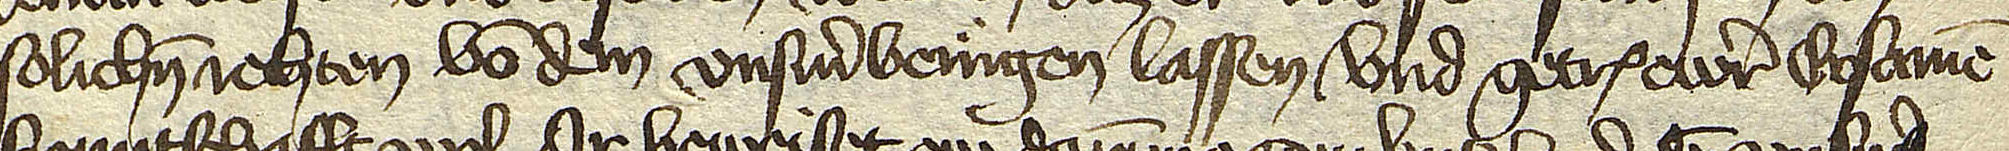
ſolichn rechten vo* dem vnſm* berügen laſſen / vnd getr* ewr* Erſame*
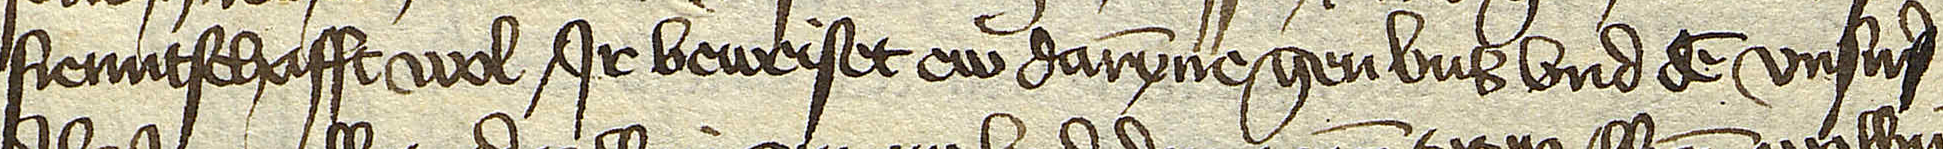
freuntſchafft wol / Ir beweiſet ew* daryne* gen vns vnd de* vnſm*
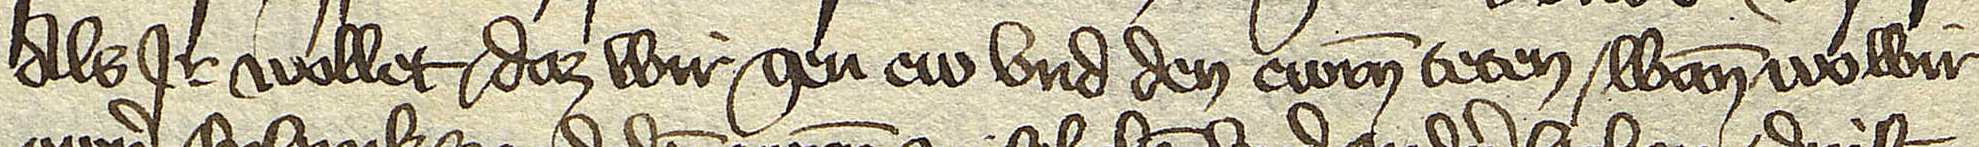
Als Ir wollet / daʒ wir gen ew vnd den ewrn* teten / wan* wo wir
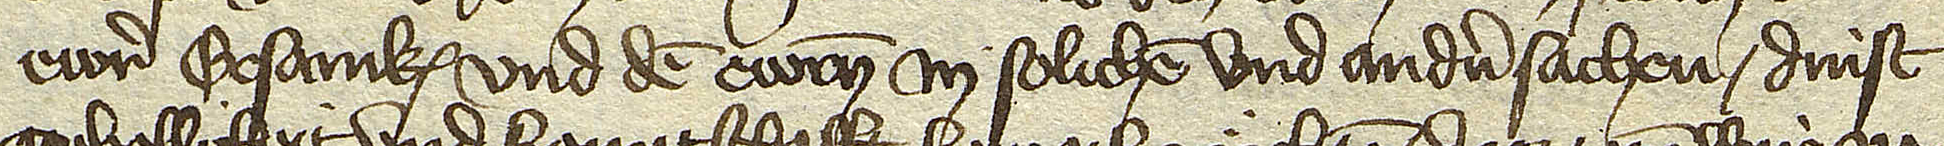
ewr* Erſamk* vnd de* ewrn* in ſoliche* vnd andn* ſachen / dinſt
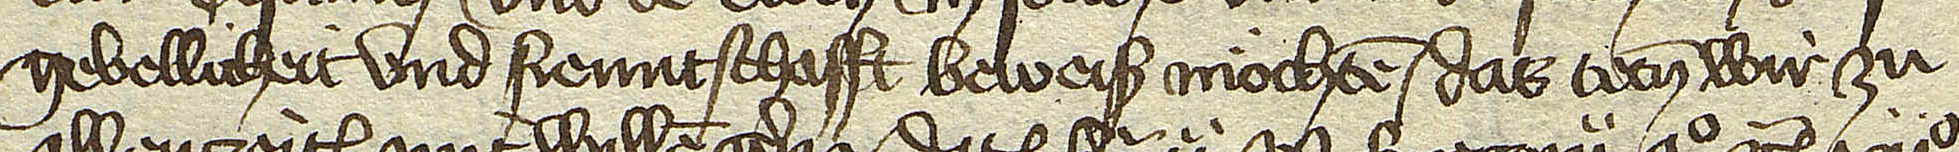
gevellicheit vnd freuntſchafft beweiſ* möchte* / das tetn* wir cʒu
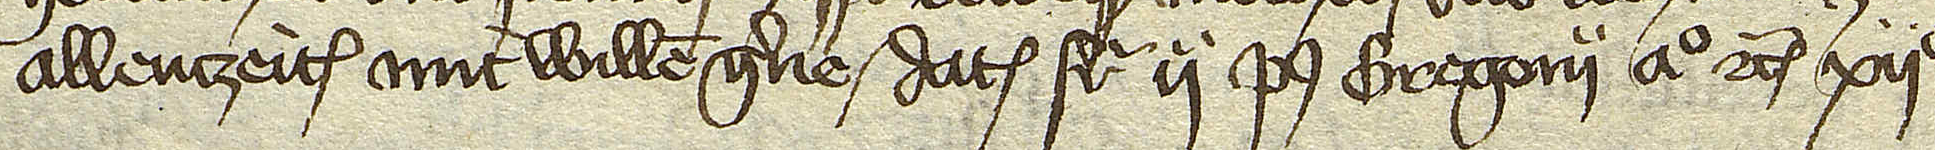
allencʒeit* mit wille* g*ne / dat* fr* ii* p* Gregorii a* ec* xii*
